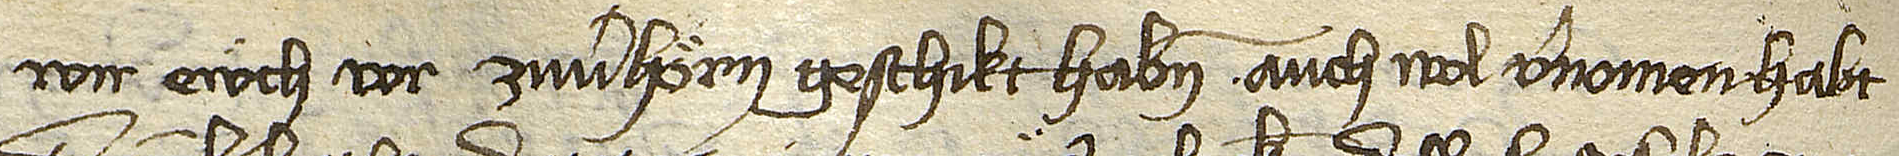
wir eẅch vor ʒuu*hörn geſchikt habn* . auch wol v*nomen habt
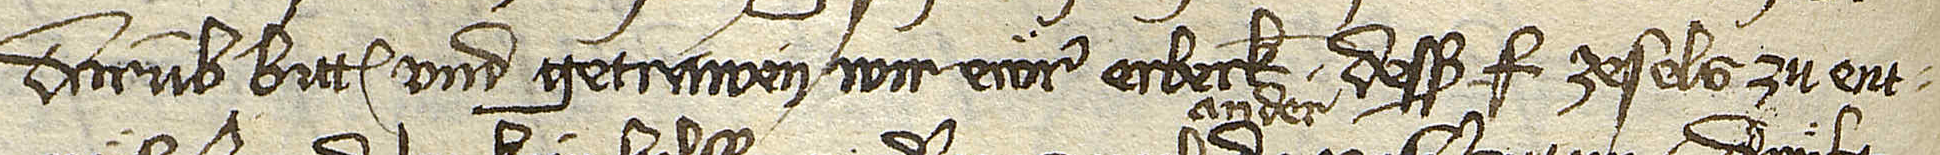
Darub* bitt* vnd getrawen wir eẅr* erberk* / Deſſ* f ʒeſels ʒu ent =
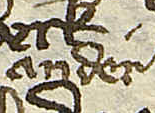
ander
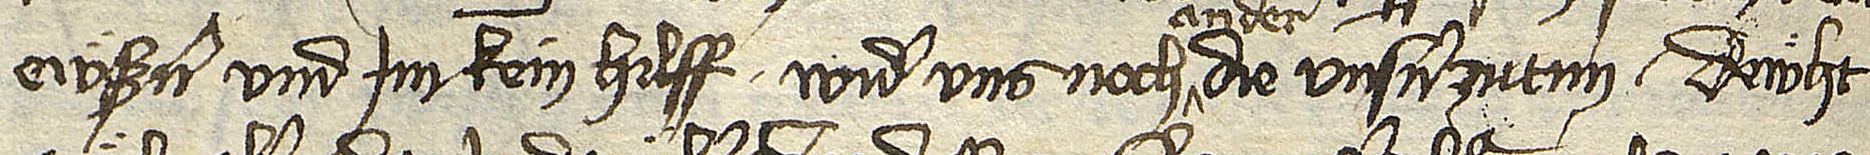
eẅſʒn* vnd Im kein hilff / wid* vns noch die vnſn* ʒutun / Deẅht
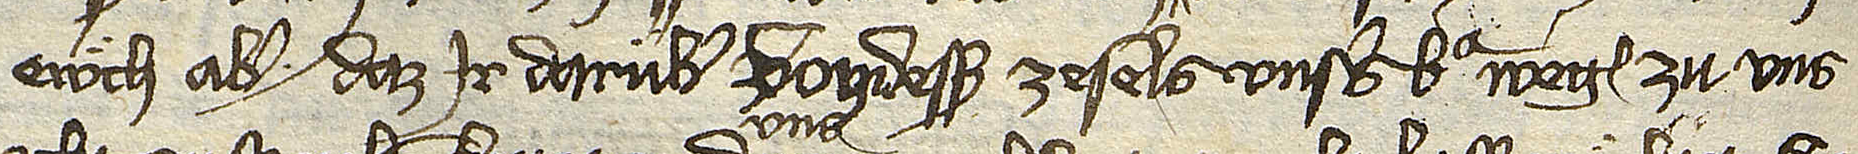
eẅch ab* . daʒ Ir darüb* Von deſſ* ʒeſels vnſ*s b* weg* ʒu vns
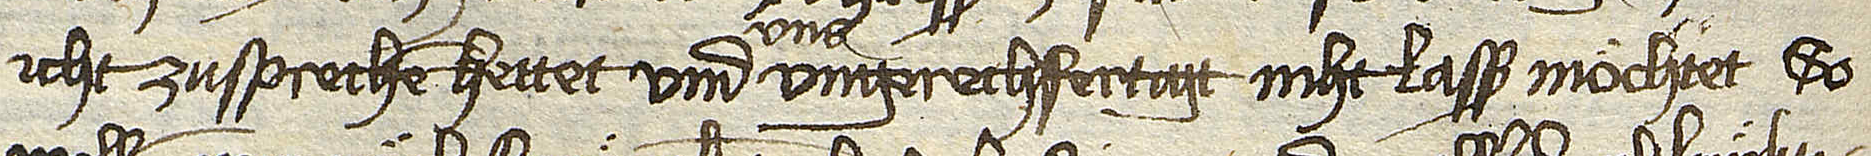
icht ʒuſpreche* hettet vnd vngerechfertigt niht laſſ* möchtet So
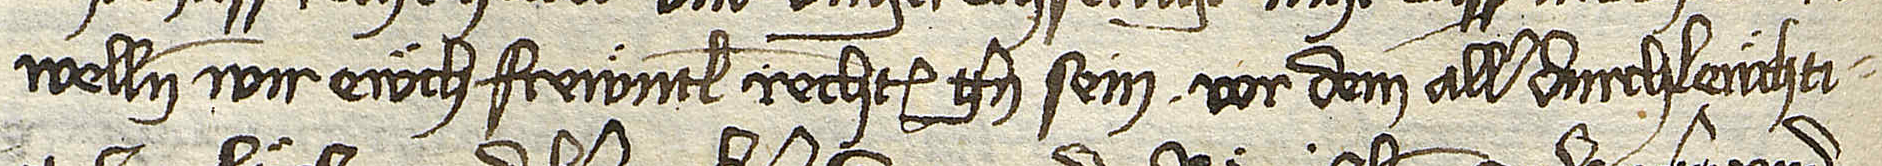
welln* wir eẅch freẅntl* recht* g*n ſein . vor dem all* durchleẅchti =
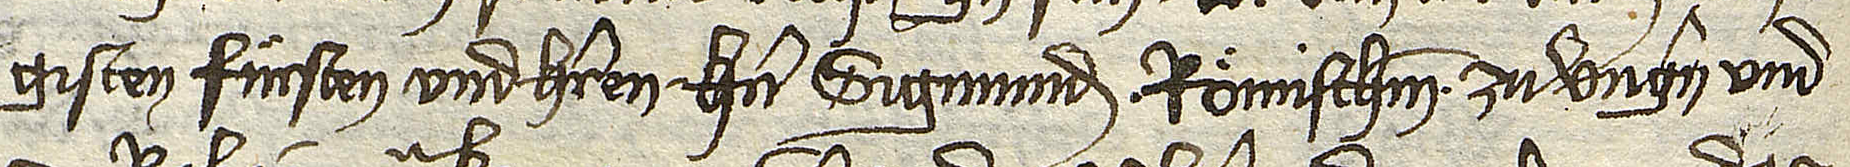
giſten fürſten vnd h*ren / Hn* Sigmund* . Römiſchm* . ʒu Vng*n vnd
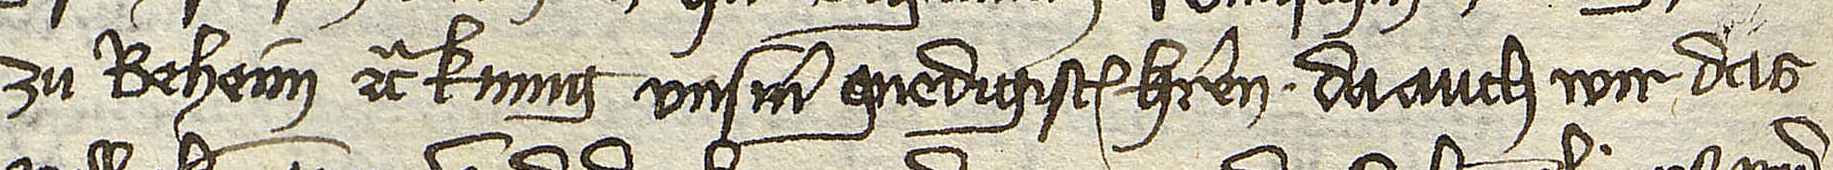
ʒu Beheim ec* kunig vnſm* gnedigiſt* h*ren . da auch wir das
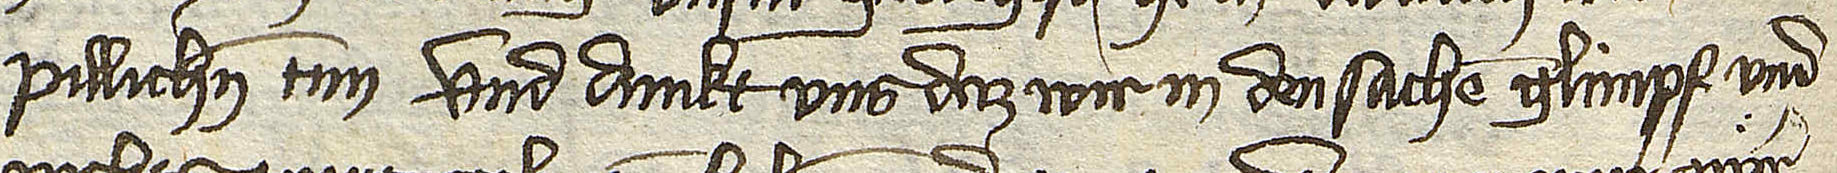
pillichn* tun Vnd dunkt vns daʒ wir in den ſache* glimpf vnd
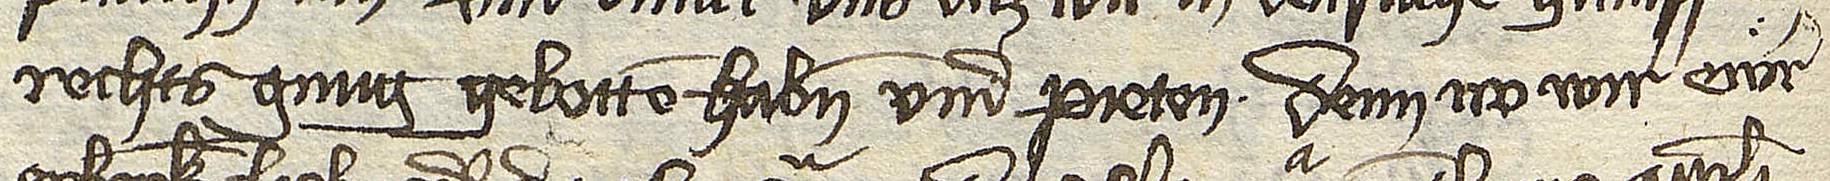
rechts gnug gebotte* habn* vnd Pieten . Denn wo wir eẅr*
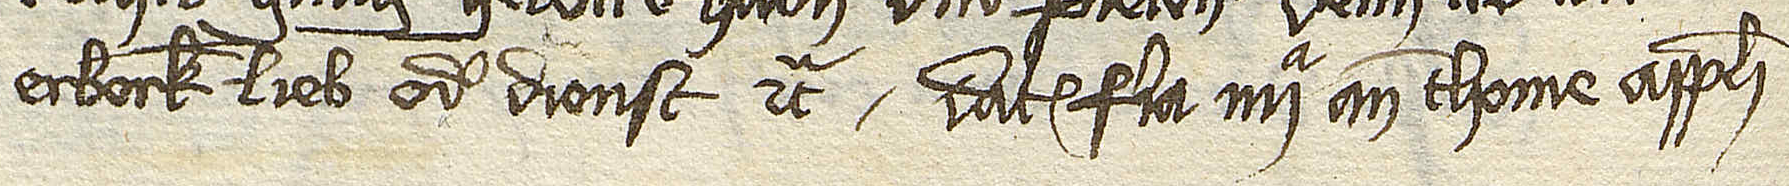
erberk* lieb od* dienſt ec* / Dat* fi*a iiii* an* thome appli*
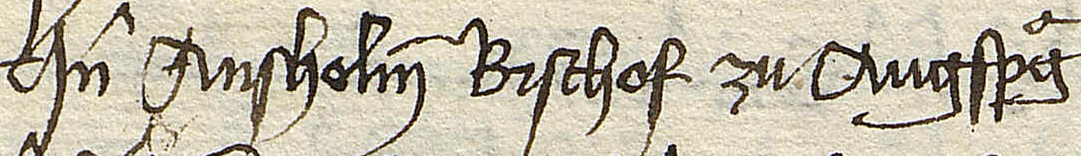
Hn* Anſhelm* Biſchof ʒu Augſp*g
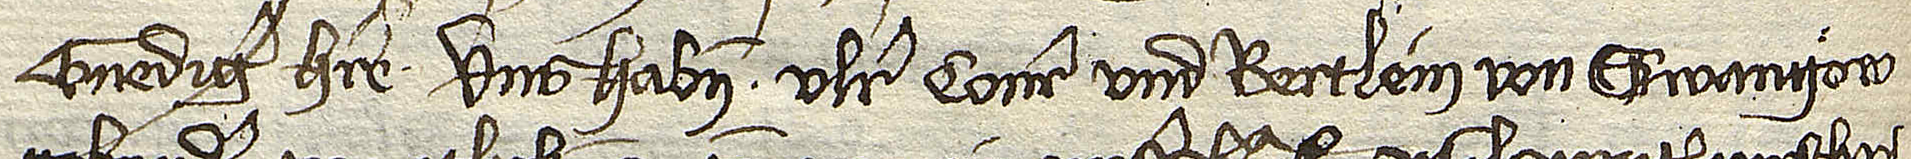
Gnedig* h*re . Vns habn* . vlr* Conr* vnd Bertlein von Swangöw
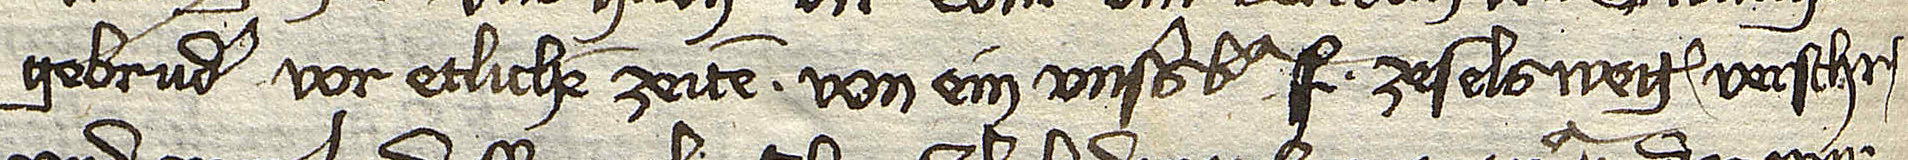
gebrud* vor etliche* ʒeite* . von ein vnſ*s b* . f . ʒeſels weg* verſchr*
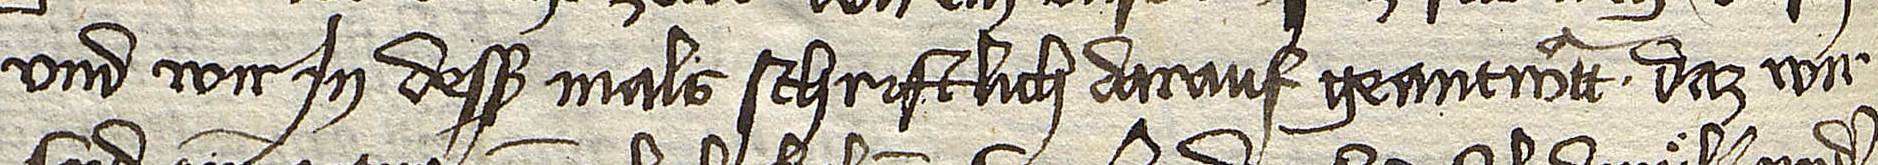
vnd wir In deſſ* mals ſchriftlich darauf geantw*tt . daʒ wir
